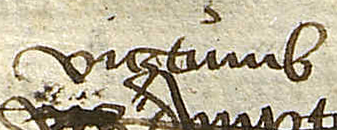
vicʒtümb
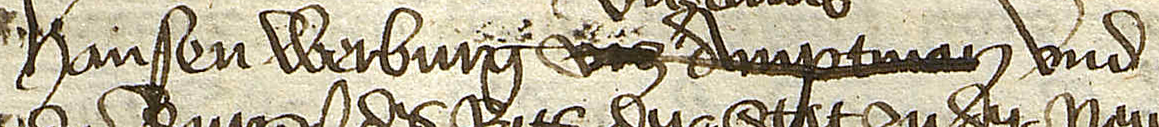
Hanſen Werburg viʒ Amptman Vnd
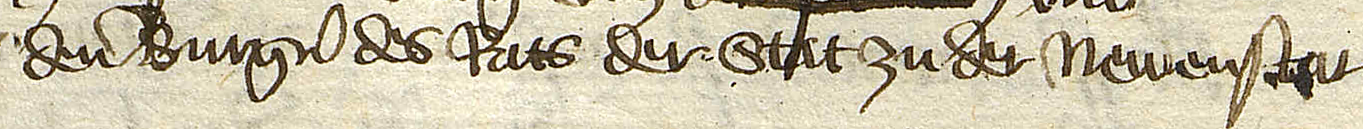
den Burg*n des Rats der Stat cʒu der Newenſtat
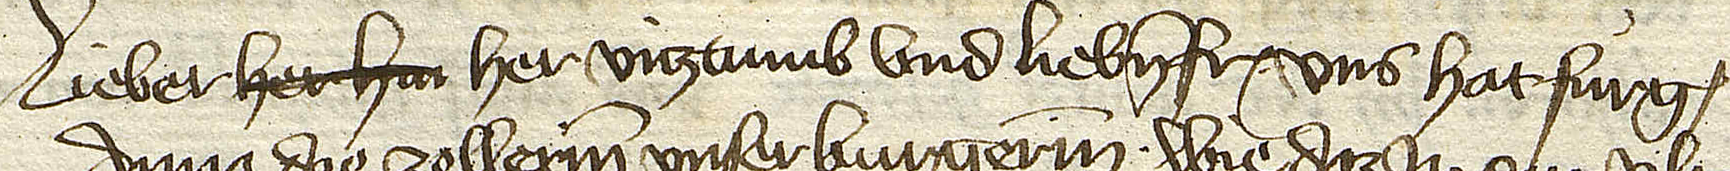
Lieber her ha her vicʒtumb vnd lieb*n fr* . vns hat fürg*
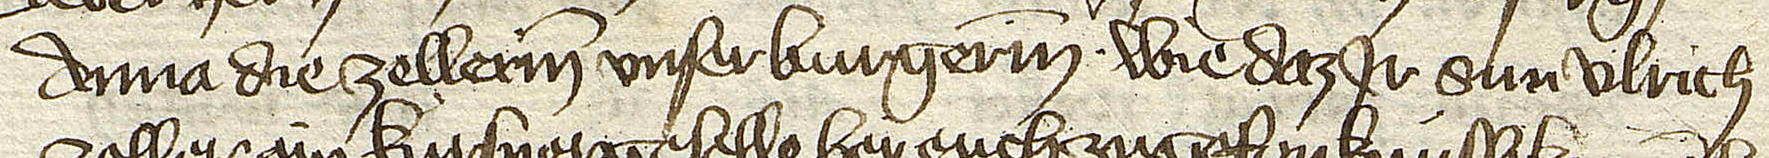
Anna die cʒellerin* vnſer burgerin* . Wie daʒ Ir Sun vlrich
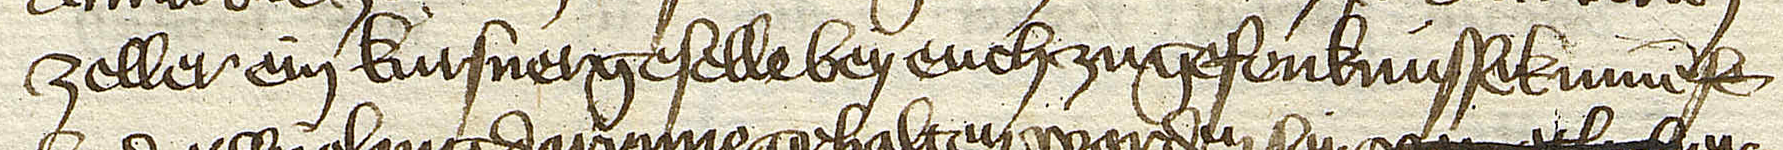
cʒeller ein kürſnergeſelle bey euch cʒu gefenknüſſe kume* ſe
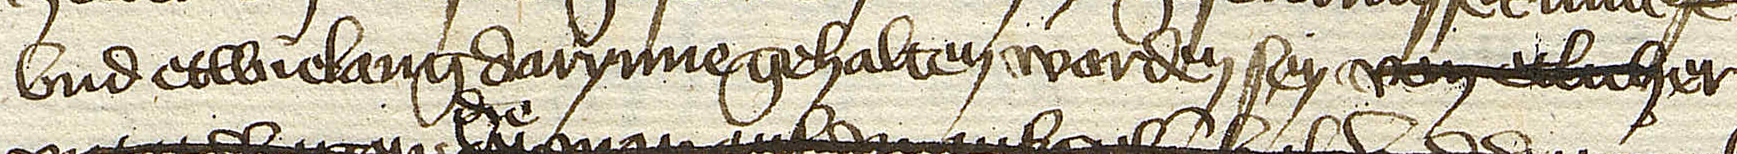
und etwielang darynne gehalten worden ſey von etlicher
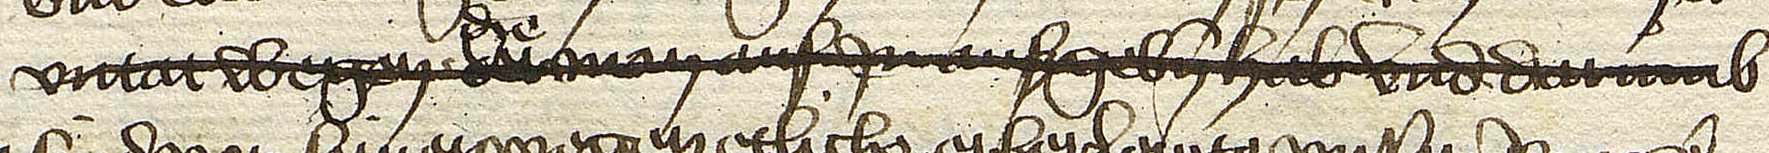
vntat wegen . der man auf In auſ*geb*n hab Vnd darümb
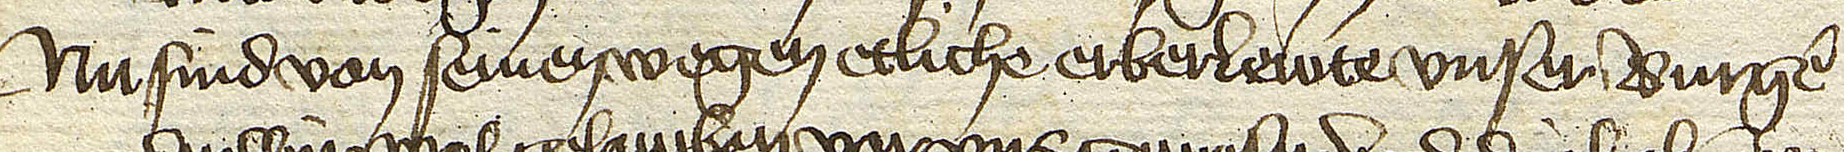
Nu ſind von ſeiner wegen etliche erber lewte vnſer Burge*
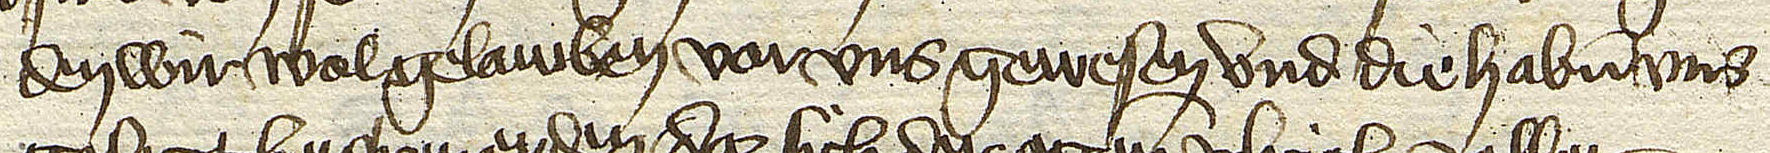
den wir wol gelawben vor vns geweſen Vnd die hab*n vns
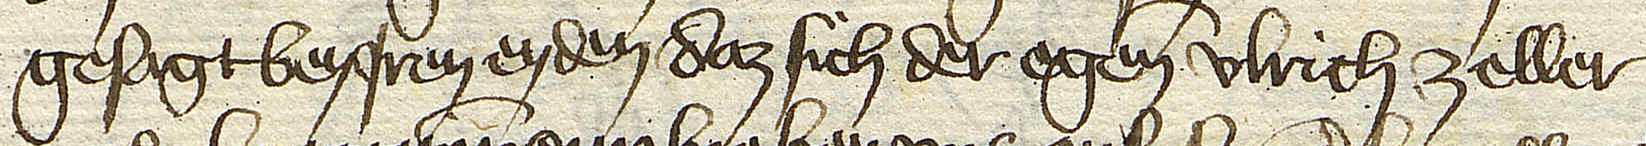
geſagt bey Iren eyden / daʒ ſich der egen* vlrich cʒeller
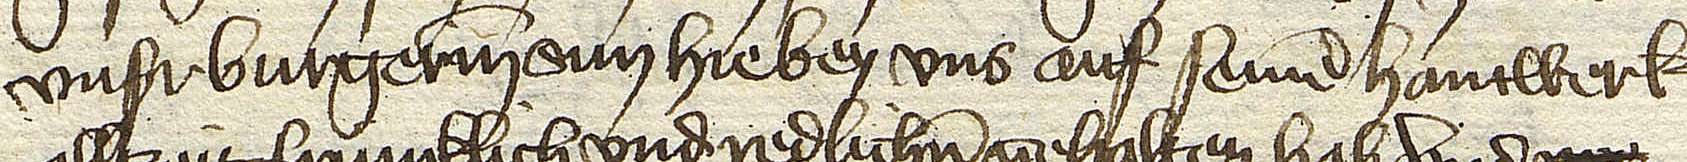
vnſ*r burger*in Sun hie bey vns auf ſeine* hantwerk
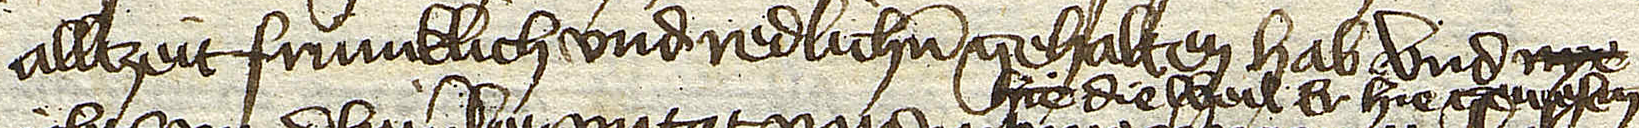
allcʒeit frümklich vnd redlich*n gehalten hab Vnd nye
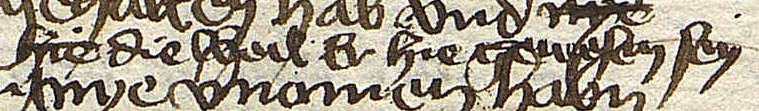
hie dieweil Er hie geweſen ſey
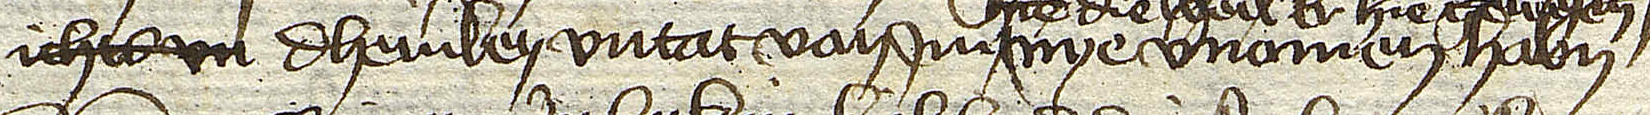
ichts vn dhein*ley vntat von Im nye v*nomen hab*n
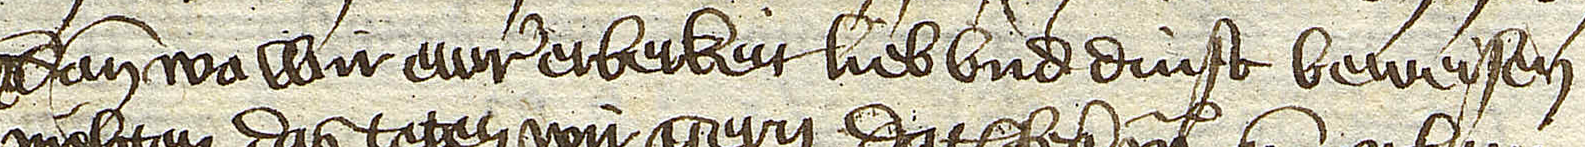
dan* wo wir ew*r erberkeit lieb vnd dinſt beweiſen
